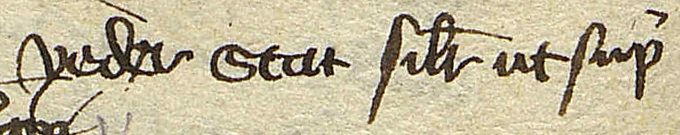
yeder Stat ſilr* ut ſup*
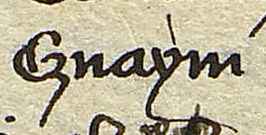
Cʒnaym
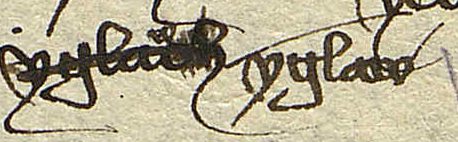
Yglach yglaw
